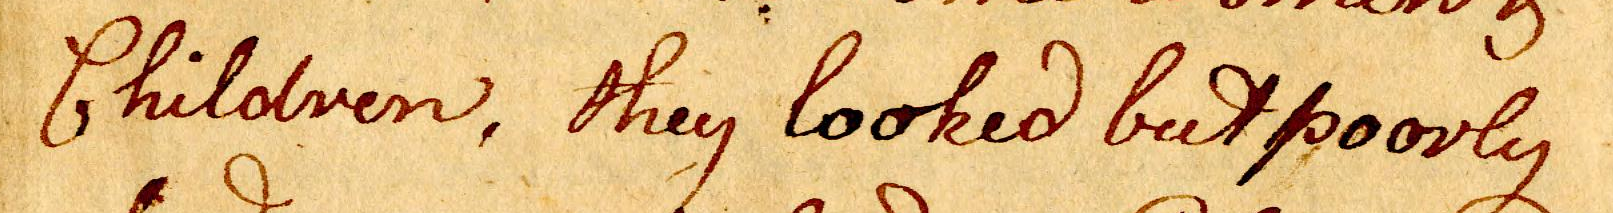Children, they looked but poorly
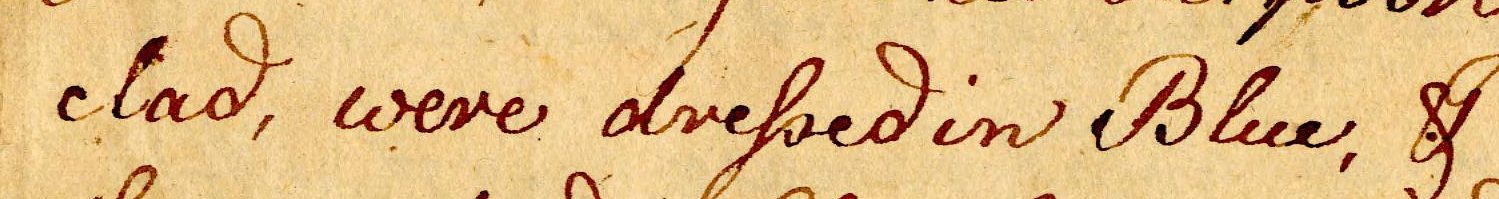clad, were dressed in Blue, &
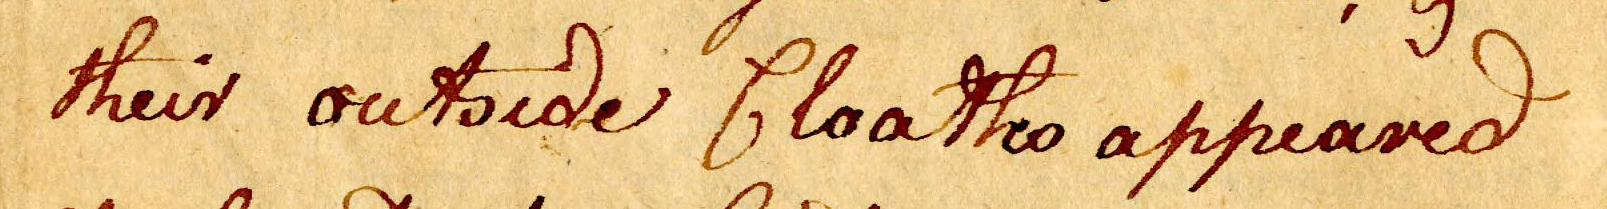their outside Cloaths appeared
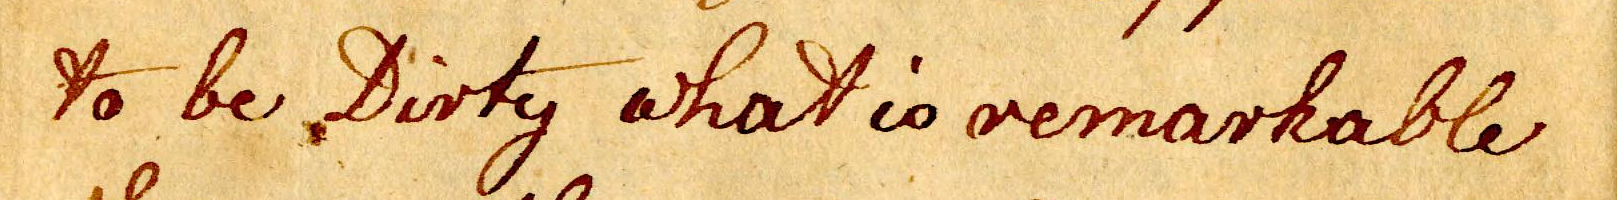to be Dirty what is remarkable
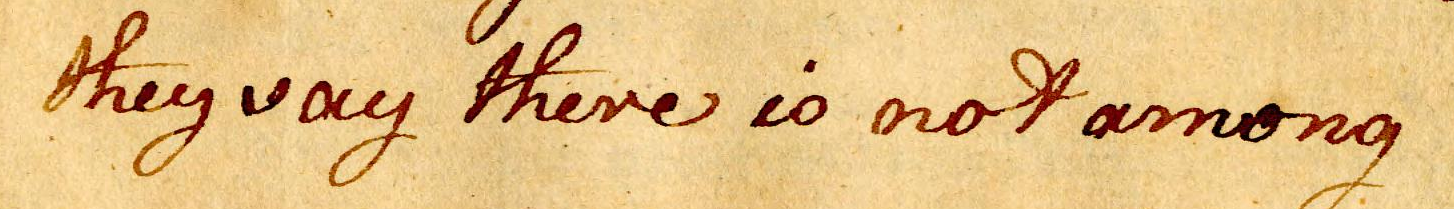they say there is not among
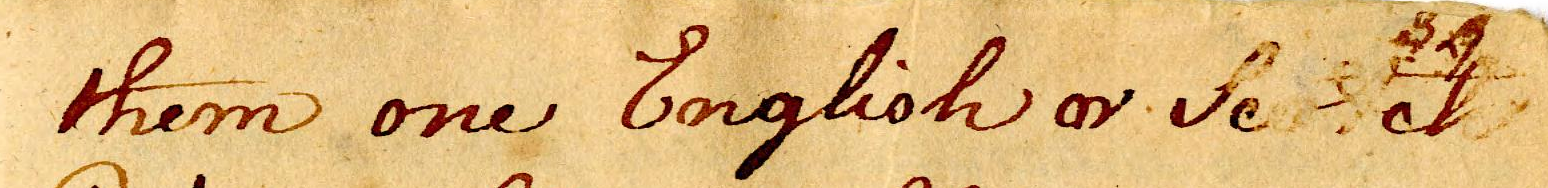them one English or Scotch
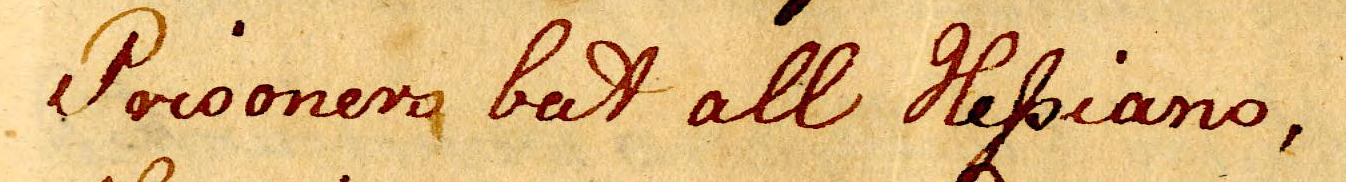Prisoners but all Hessians,
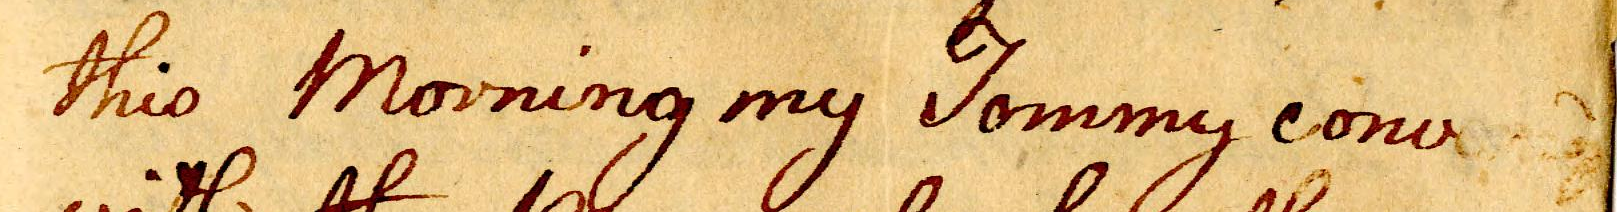this Morning my Tommy conversd
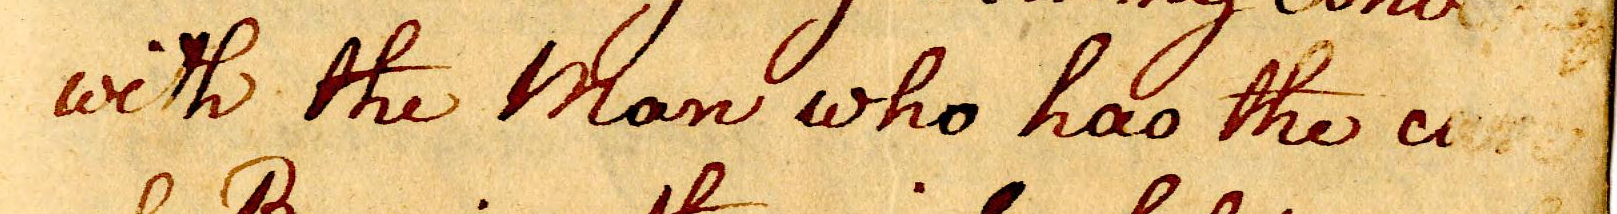with the Man who has the care
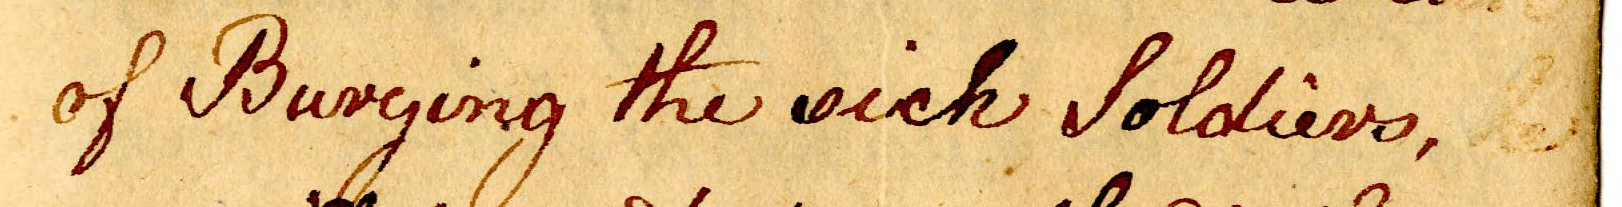of Burying the sick Soldiers, he
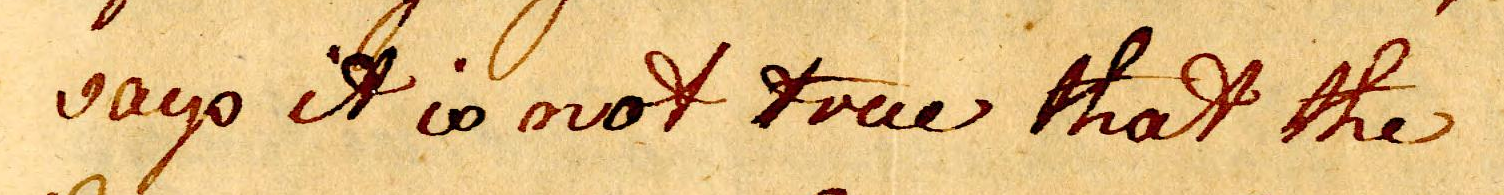says it is not true that the
